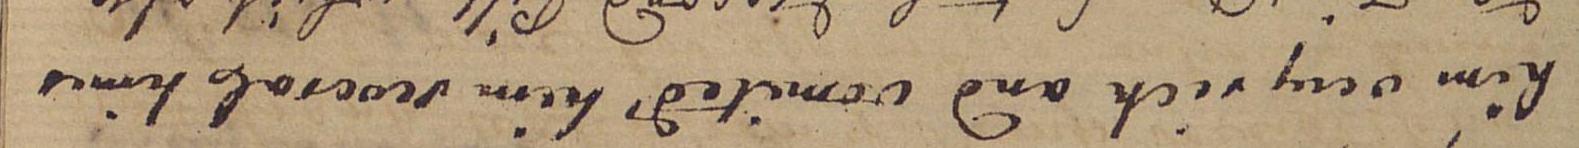him very sick and vomited him several times
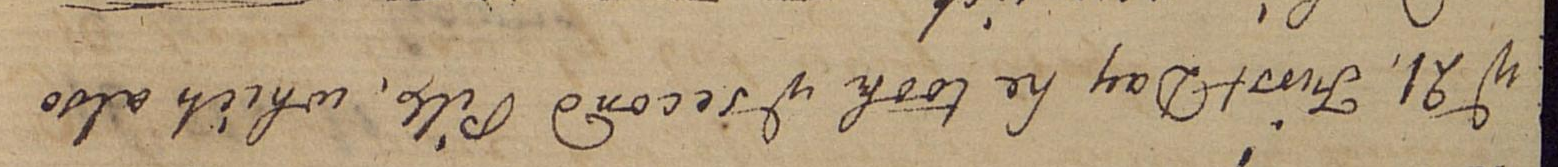y^e 21. First Day he took y^e second Pill, which also
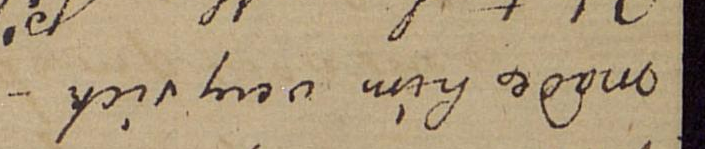made him very sick.
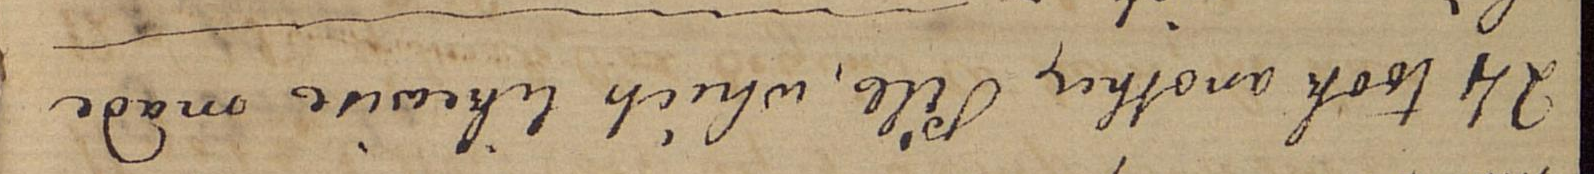24 took another Pill, which likewise made
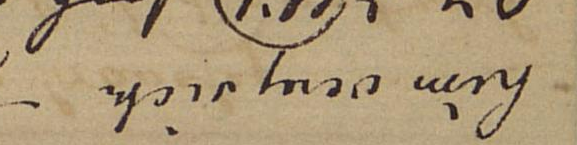him very sick-
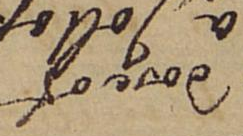dose of
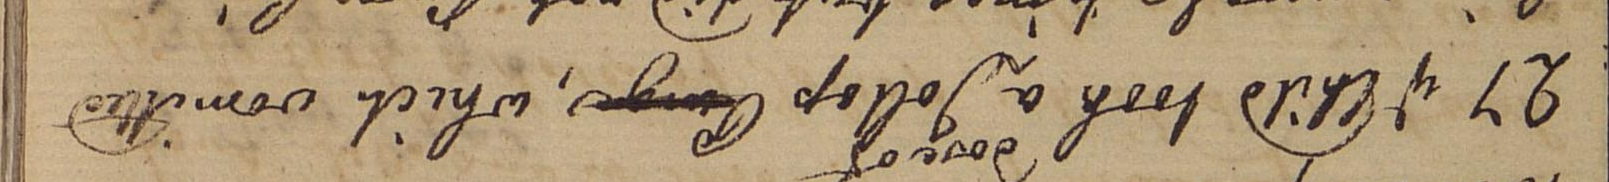27 y^e Child took a ^ Jollop [Purge], which vomitted
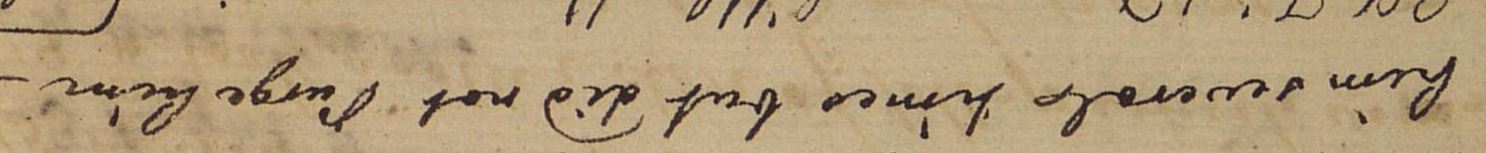him several times but did not Purge him-
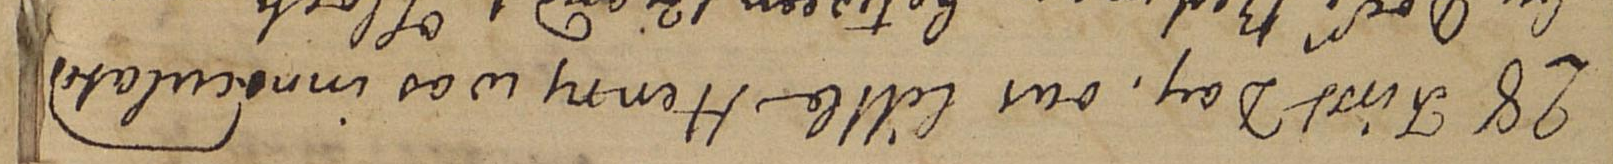2 8 First Day, our little Henry was innoculated
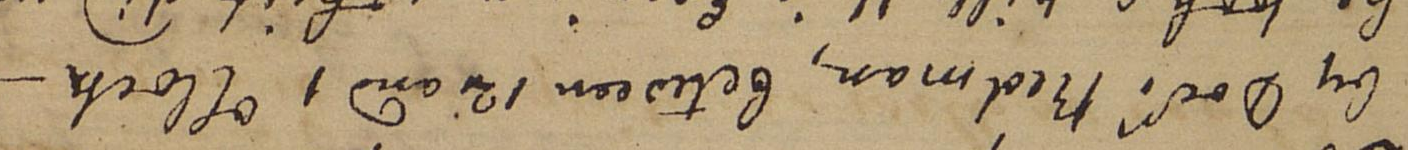by Doc^r. Redman, between 12 and 1 oClock-
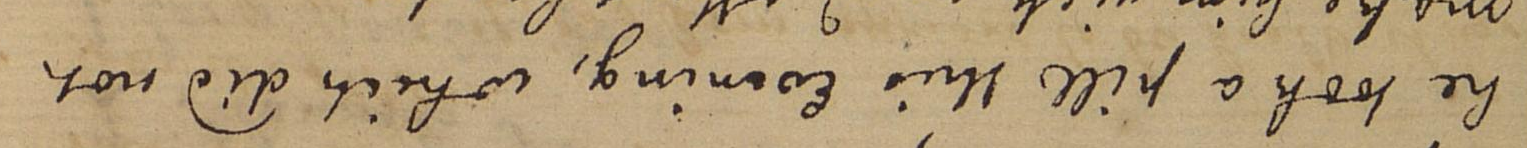he took a pill this Evening, which did not
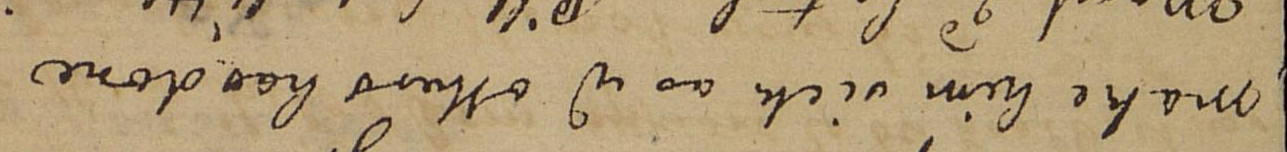make him sick as y^e others has done
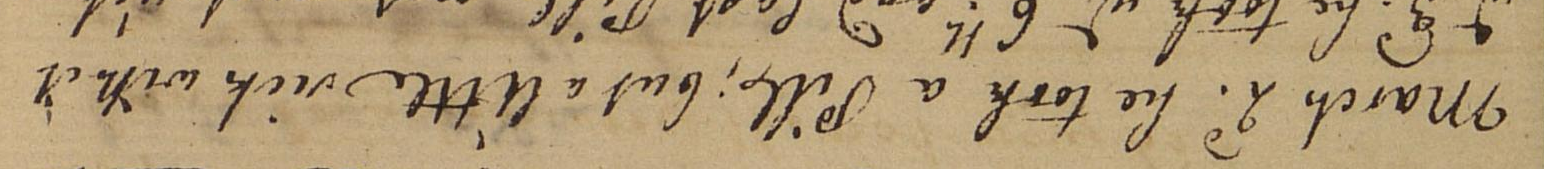March 2^d. he took a Pill; but a little sick with it
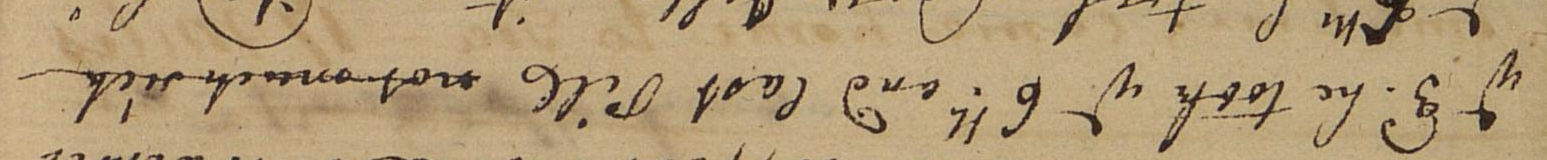y^e 3^d. he took y^e 6^th. and last Pill not much sick
